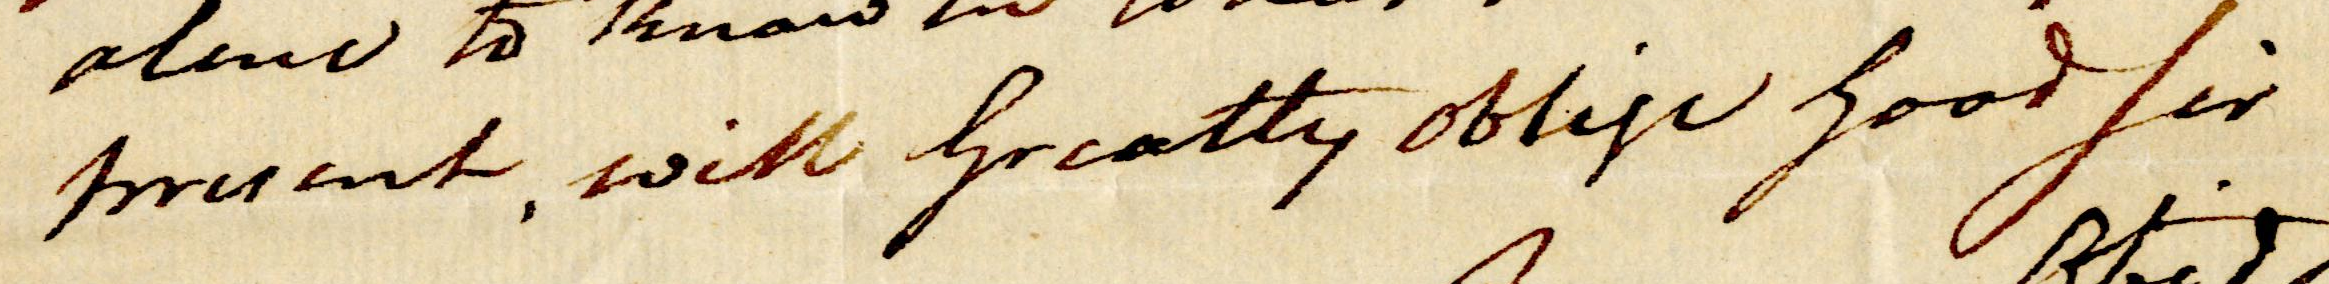presant, will Greatly oblige Good Sir
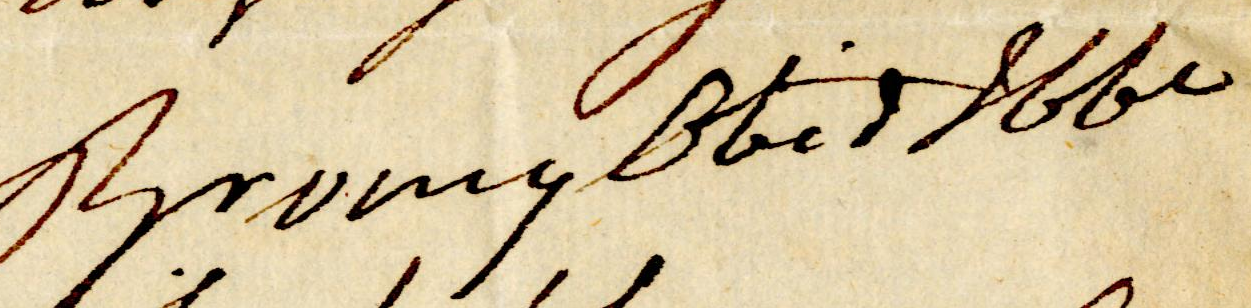Y^r very Obe^d. & able
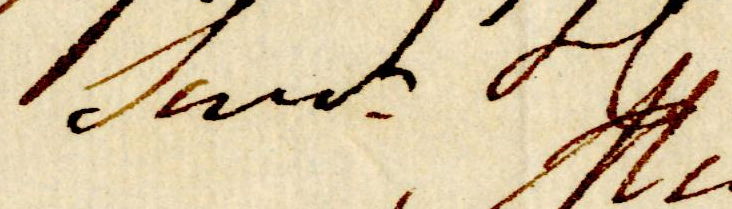serv^t. &C
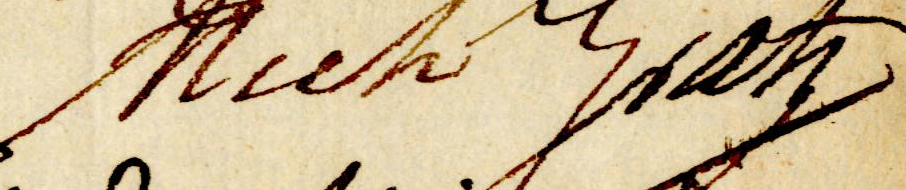Mich^l Gratz
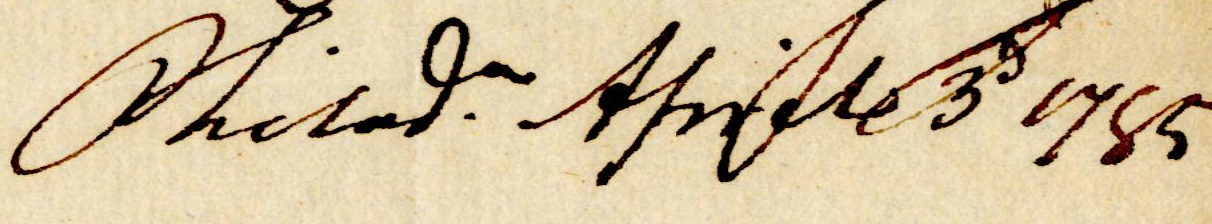Philad^a: April 3^d 1785
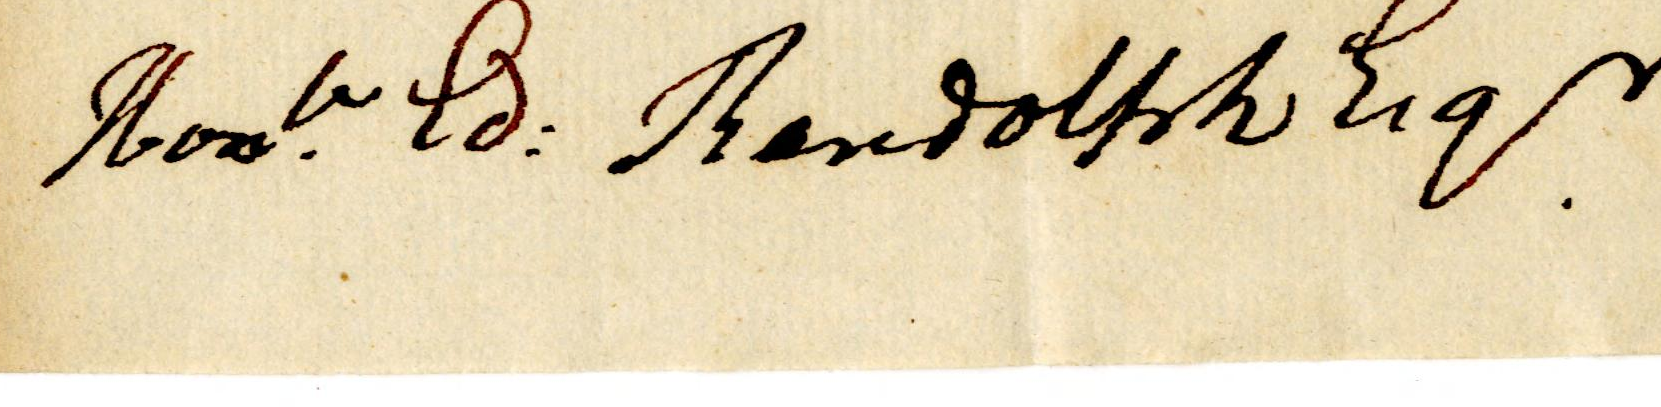Hon^b. ld: Randolph Esq^r
